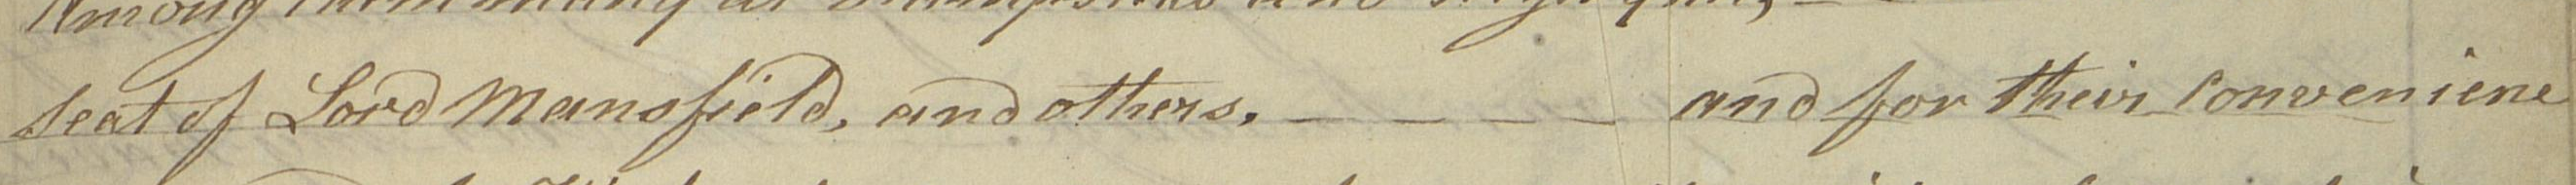Seat of Lord Mansfield and others, and for their Convenience
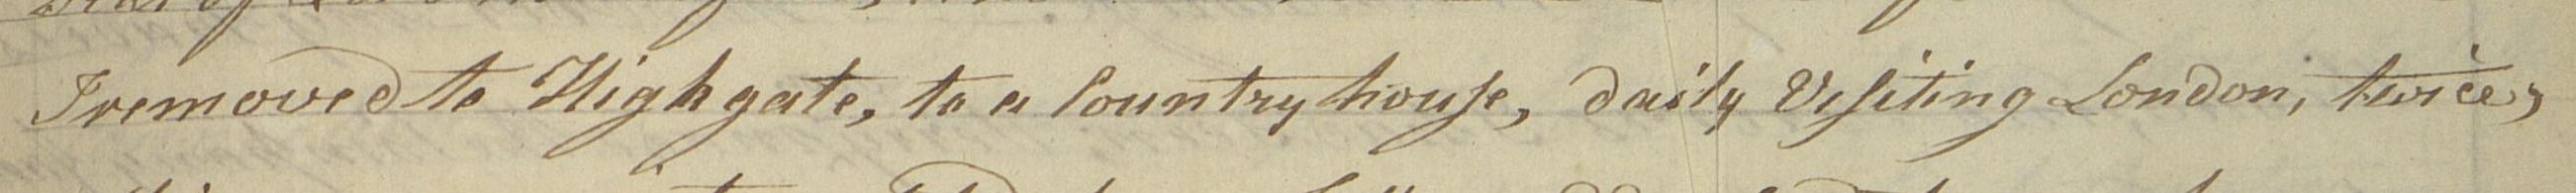I removed to Highgate, to a Country house, daily visiting London, twice,
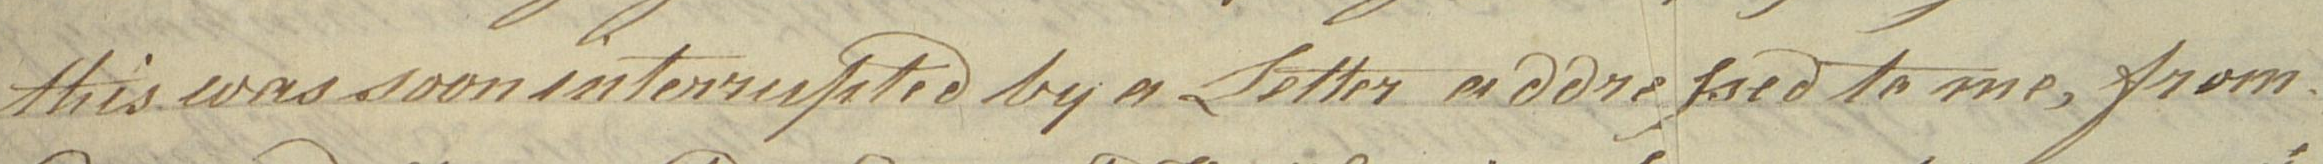this was soon interrupted by a Letter addressed to me, from
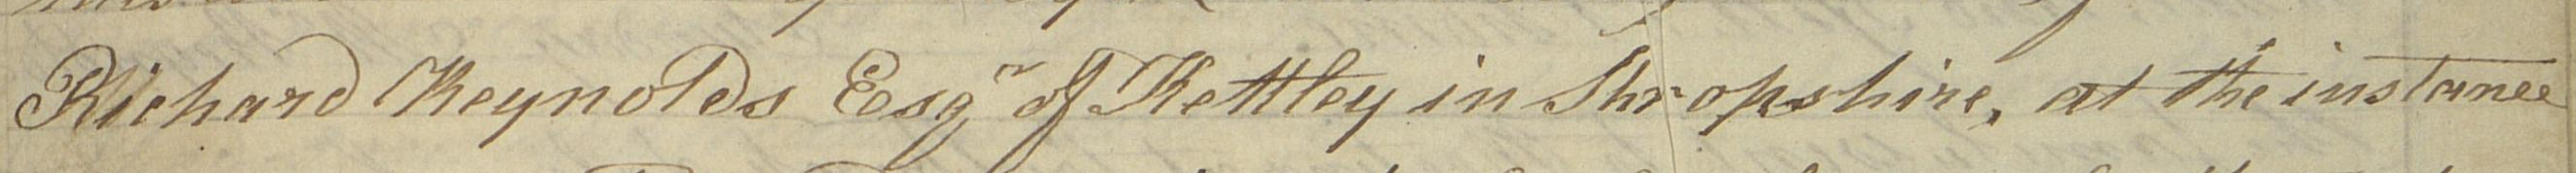Richard Reynoles Esq^r of Kettley in Shropshire, at the instance
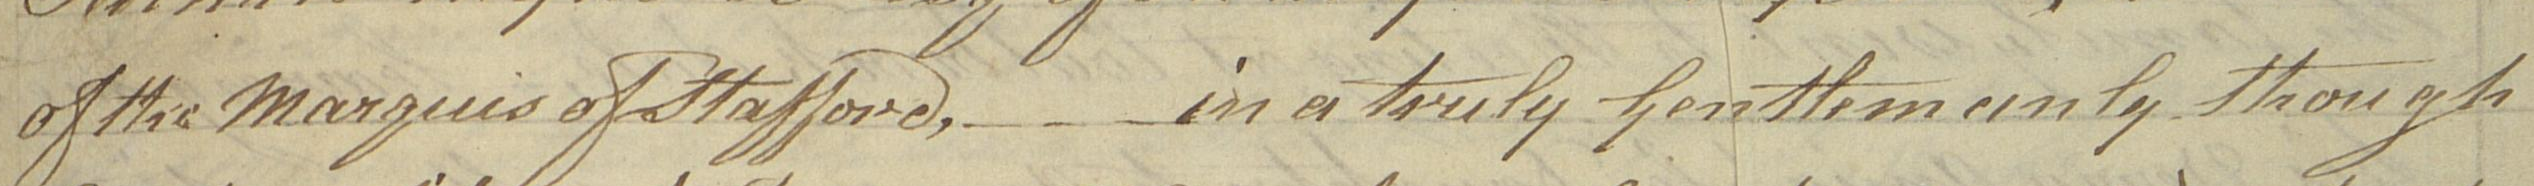of the Marquis of Stafford, in a truly Gentlemanly though
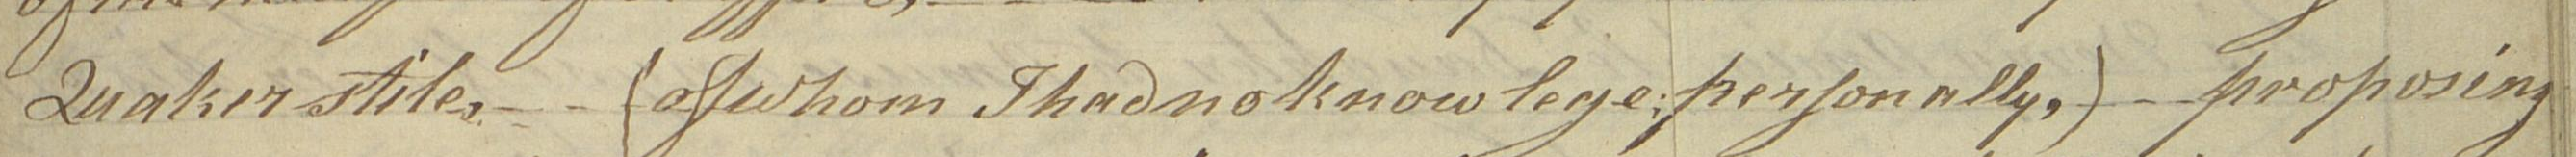Quakerstile, (of whom I had no knowlege personally.) proposing
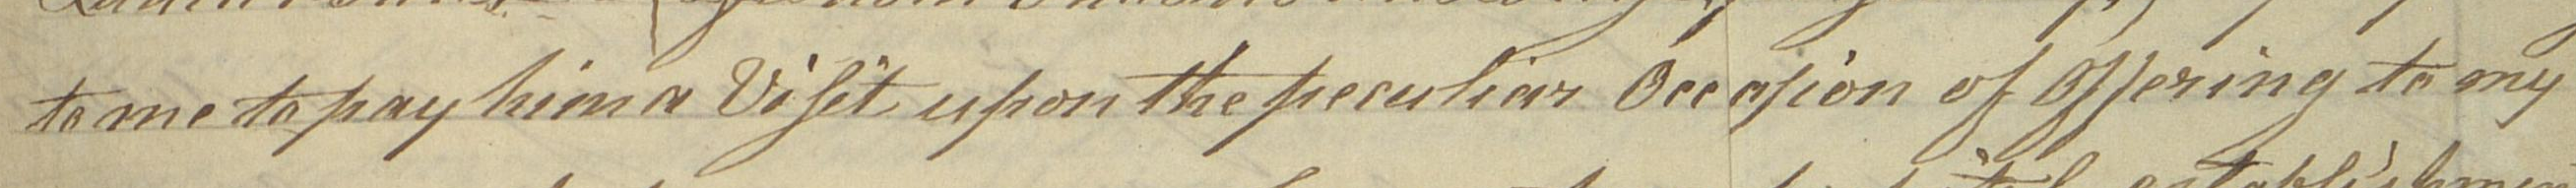to me to pay him d visit upon the peculiar occasion of offering to my
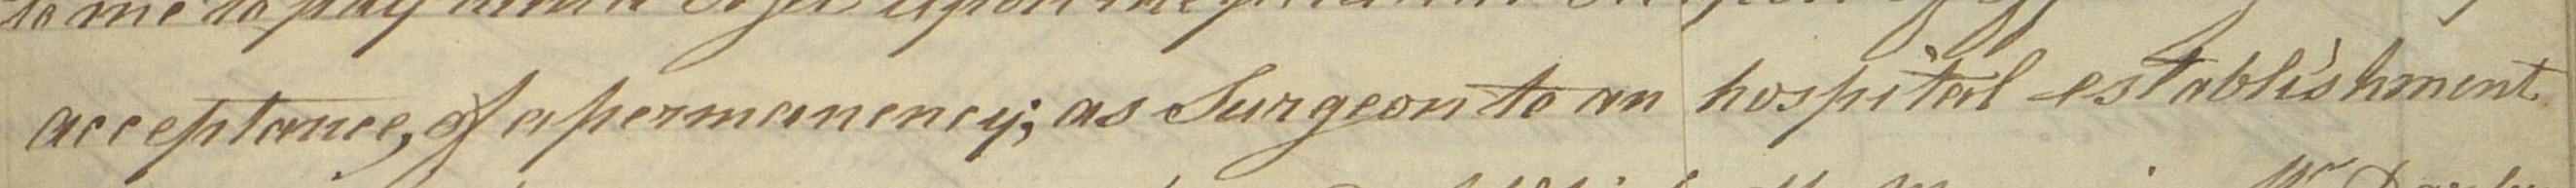acceptance of permanency; as Surgeon to an hospital establishment
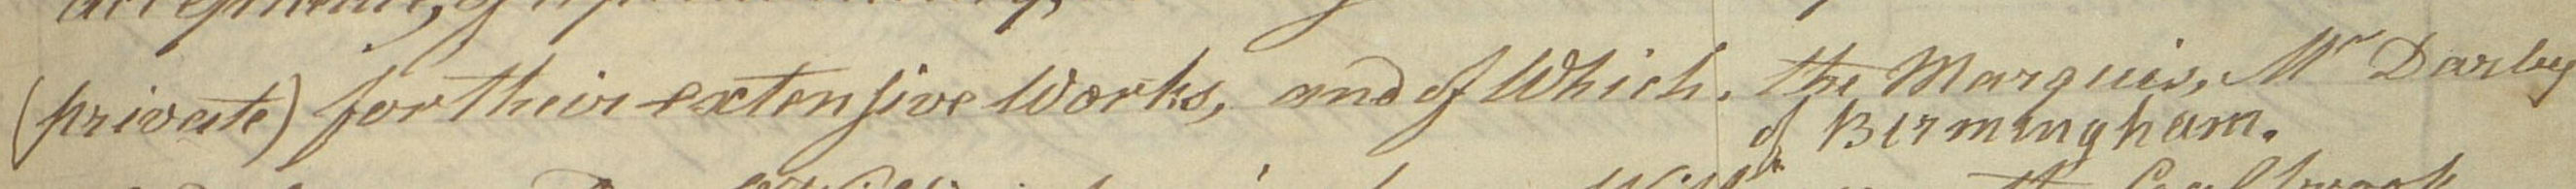(private) for their extensive Works and of Which, the Marquis, M^r Darby
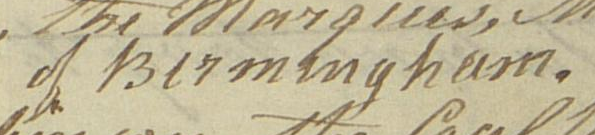of Birmingham
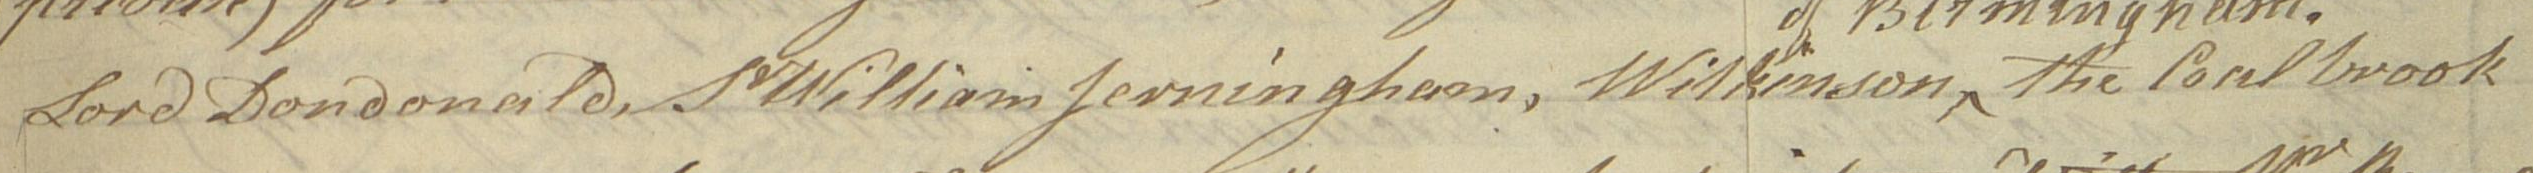Lord Dondonald, S^r William Jerninghon Wilkinson ^ the Coal brook
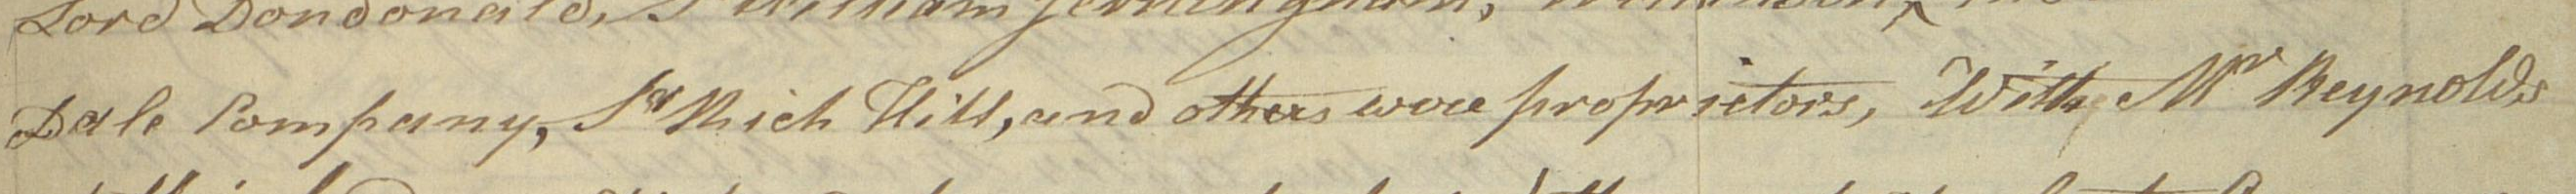Dale Company, S^t Rich Hill, and others were proprietors, With M^r Reynolds
